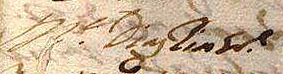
M.a Dias Pinhr.a
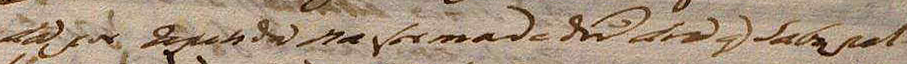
da por Repetida na forma de drto diz q̄ sabe pel
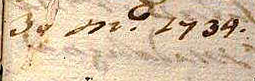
30 m.ço 1734.
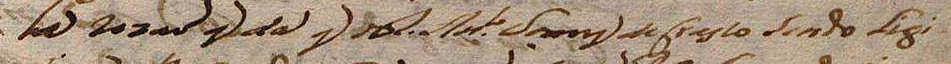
ha rezaõ q̄ da q̄ o R. Ant.o Soarez de Crasto sendo Ligi
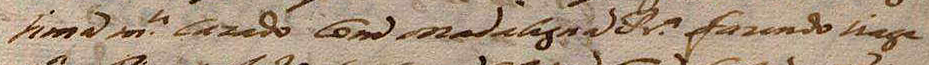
timam.te cazado com madalegna Pr.a fazendo viage
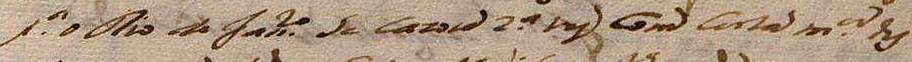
p.a o Rio de Jan.ro se cazou 2.a ves Com Certa m.er des
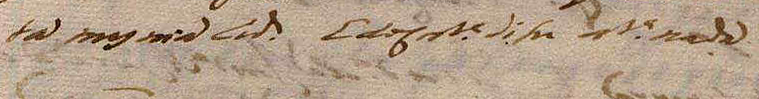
ta mesma cid.e e do Cost.e disse a t.a nada
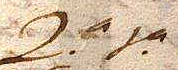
2.a t.a
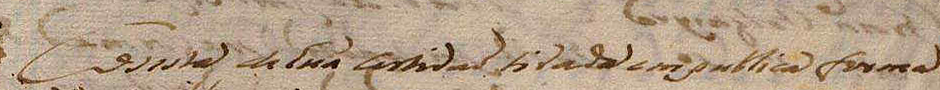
Consta de huā certidaõ tirada em publica forma
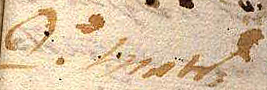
2.o matr.o
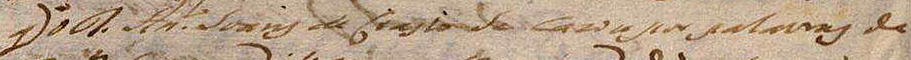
q̄ o R. An.to Soares de Crasto se cazou por palavras de
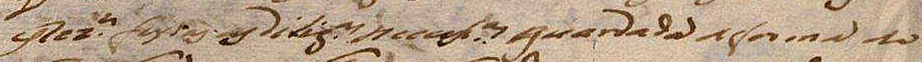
prez.te feytas as dilig.as necces.as guardada a forma do
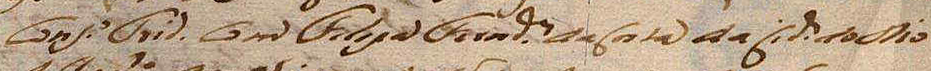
Cons.o Trid. Com Filipa Fernd.es da Costa da Cid.e do Rio
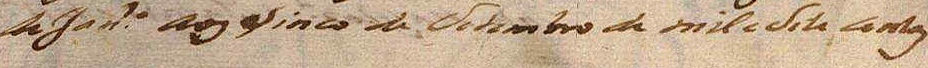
de Jan.ro aos Sinco de Setembro de mil e Setecentos
